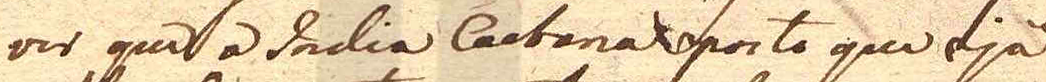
ver que a India Caetana posto que já
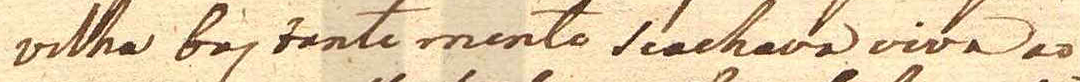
velha bastantemente se achava viva ao
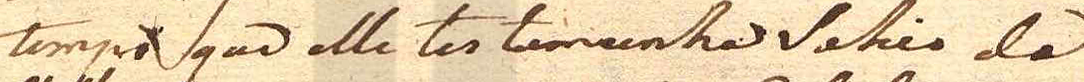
tempo que elle testemunha Sahio da
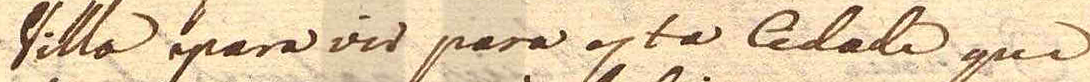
Villa para vir para esta Cidade que
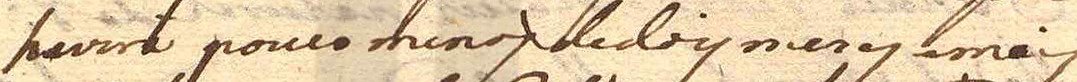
havera pouco menos de dois mezes e mais
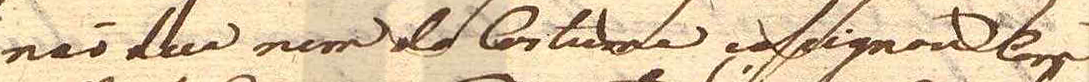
não dice nem do Costume e assignou com
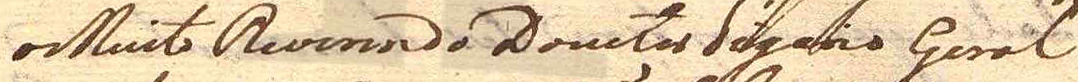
o Muito Reverendo Doutor bigário Geral
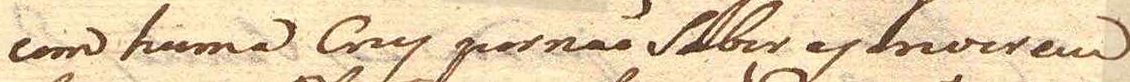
com huma Crus por naõ Saber escreverem
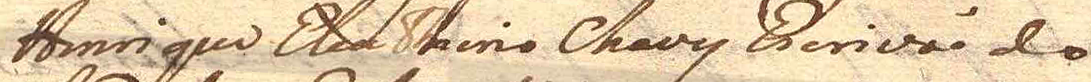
Henrique Eleutherio Chaves Escrivaõ do
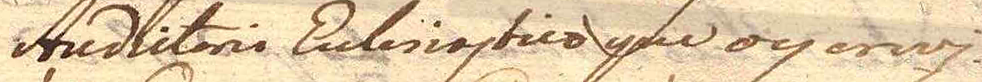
Audictorio Ecclesiastico que o escrevj.
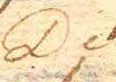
De
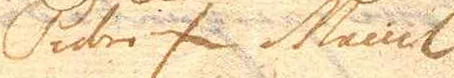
Pedro + Maciel
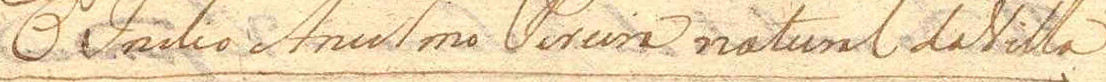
O Indio Ancelmo Pereira natural da Villa
